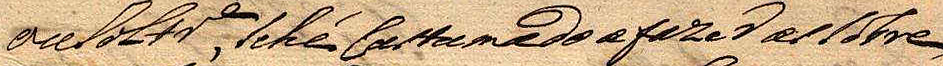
ou soLtro, se hé costumado a fazer as sobre
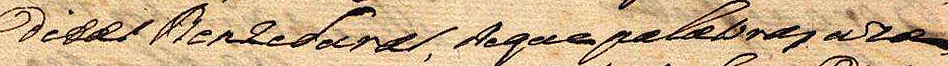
ditas Benzeduras, de que palavras uza
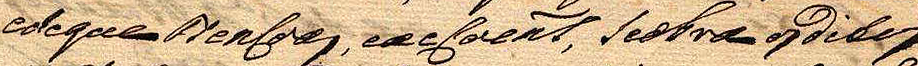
e de que BenÇaos, e acCoeñs, se obra os ditos
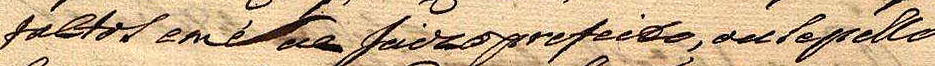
factos em seu Juizo prefeito, ou se pello
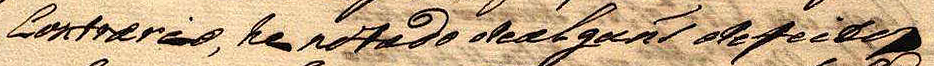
contrario, he notado de alguñs defeitos
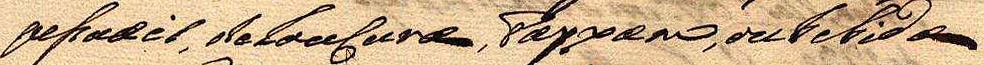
pessuais, de LouCura, Payxam, ou bebida
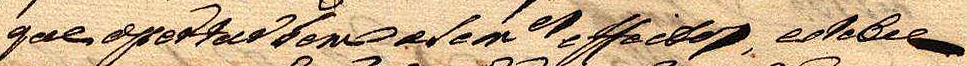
que o perturbem a semes effeitos, e de tu
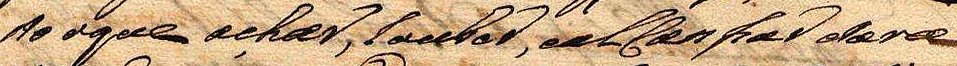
do o que açhar, souber, e alCanssar dara
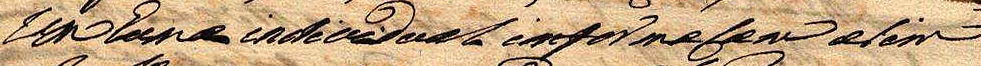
vm huma individual imformaCam asim
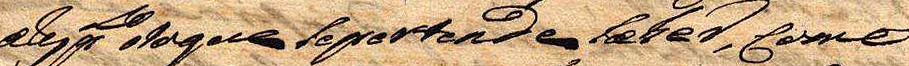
a Respto do que se pertende saber, Come
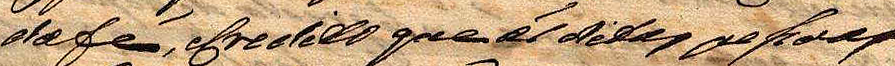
da fé, e Credito que ás ditas pessoas
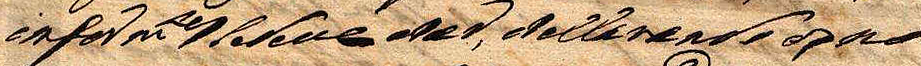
imformtes se deue dar, declarando os no
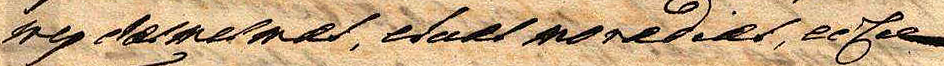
mes dos mesmos, e suas moradias, e oCu
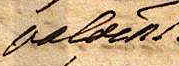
paçoeñs.
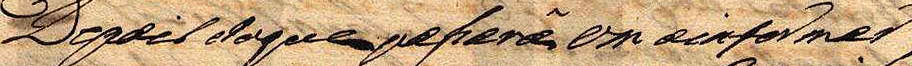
Depois do que passará vm a informer
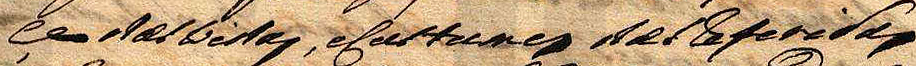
çe das vidas, e Custumes das Referidas
